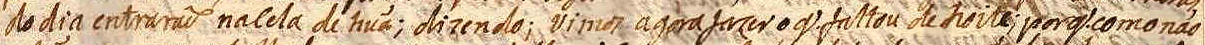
do dia entraraõ na Cela de huā; dizendo; vimos agora fazer o q̄. faltou de noite; porq̄. como não
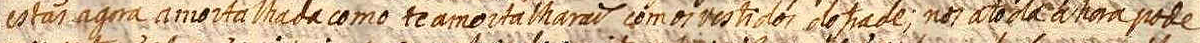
estás agora amortalhada como te amortalharaõ com os vestidos do frade; nos a toda a hora pode
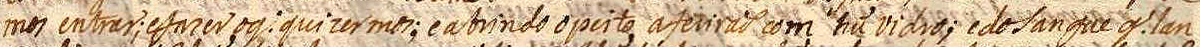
mos entrar: e fazer o q̄. quizermos; e abrindo o peito a feriraõ com hū vidro; e do sangue q̄. lan
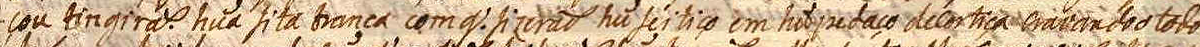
çou tingiraõ huā fita branca com q̄. fizerão hū feitiço em hū pedaço de cortiça cravando o todo
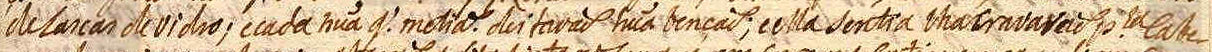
de lascas de vidro; e cada huā q̄. metia. deitavaõ huā tençaõ; e ella sentia lha cravaraõ p.la Cabe
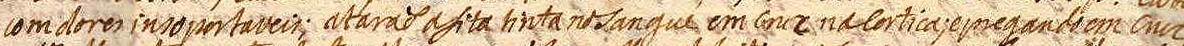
com dores insoportaveis; ataraõ a fita tinta no sangue em cruz na cortica; e pregando em cruz
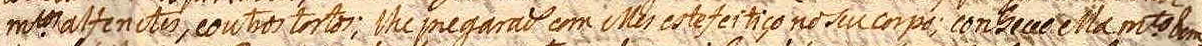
m.tos alfenetes, e outros tortos; lhe pregaraõ com elles este feitiço no seu corpo; conheceo ella m.to bem
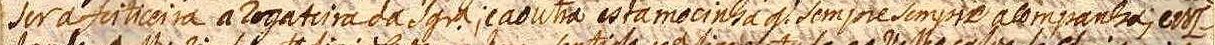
ser a feiticeira a Regateira da Igra; e a outra esta mocinha q̄. sempre sempre acompanha; e voL
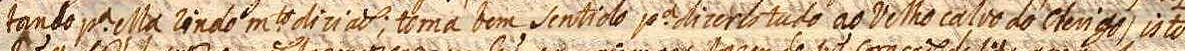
tando p.a ella Rindo m.to diziaõ; toma bem sentido p.a dizeres tudo ao velho calvo do clerigo / isto
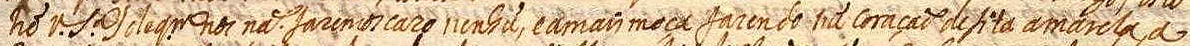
hé V. S.a / de q.m nos naõ fazemos cazo nenhū, e a mais moça fazendo hū coraçaõ de fita amarela, a
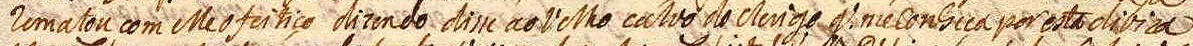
Rematou com elle o feitiço dizendo disse ao Velho calvo do clerigo q̄. me conheça por esta diviza
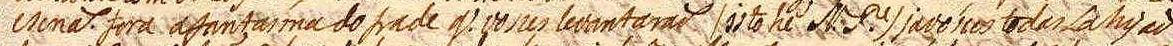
e se naõ fora a fantasma do frade q̄. vosses levantaraõ / isto he N. P.e / ja vosses todas La hyaõ
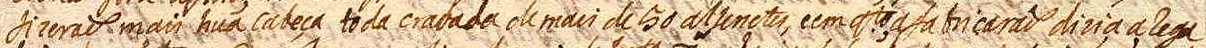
fizeraõ mais huā cabeça toda cravada de mais de 50 alfenetes, e emq̄.to a fabricaraõ dizia a Rega
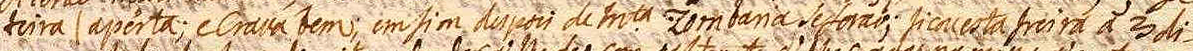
teira / aperta; e Craua bem; emfim despois de m.ta zombaria se foraõ, ficou esta freira a 3 di
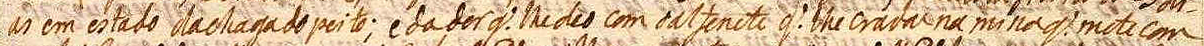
as em estado da chaga do peito; e da dor q̄. lhe deo com o alfenete q̄. lhe cravou na missa q̄. mete com
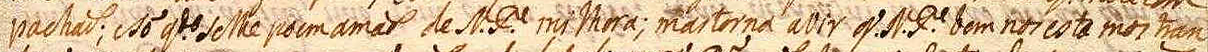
pachaõ; e só q.do se lhe poem a maõ de N. P.e milhora; mas torna a vir q̄. N. P.e bem nos esta mostran
